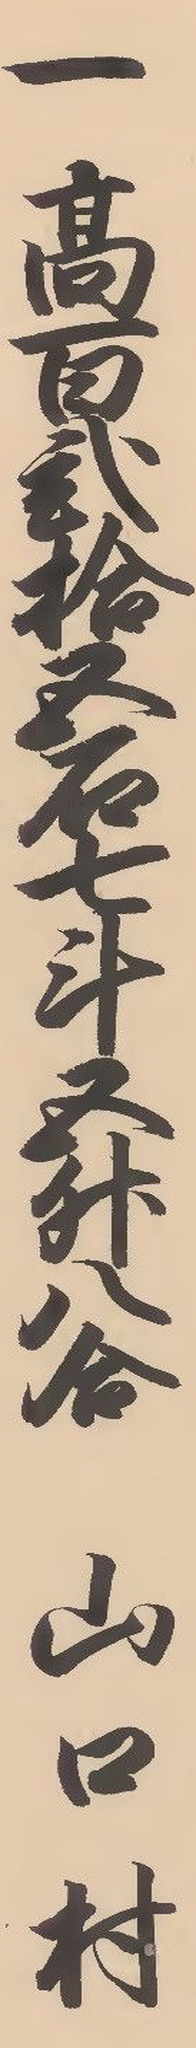一高百弐拾五石七斗五升八合山口村
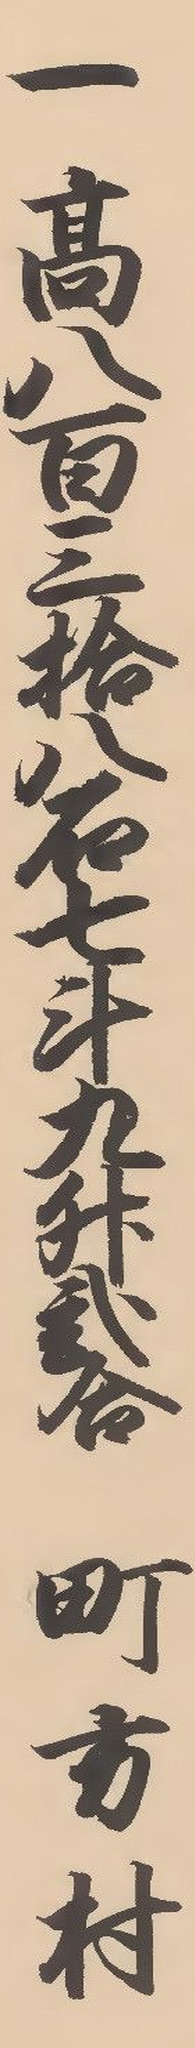一高八百三拾八石七斗九升弐合町方村

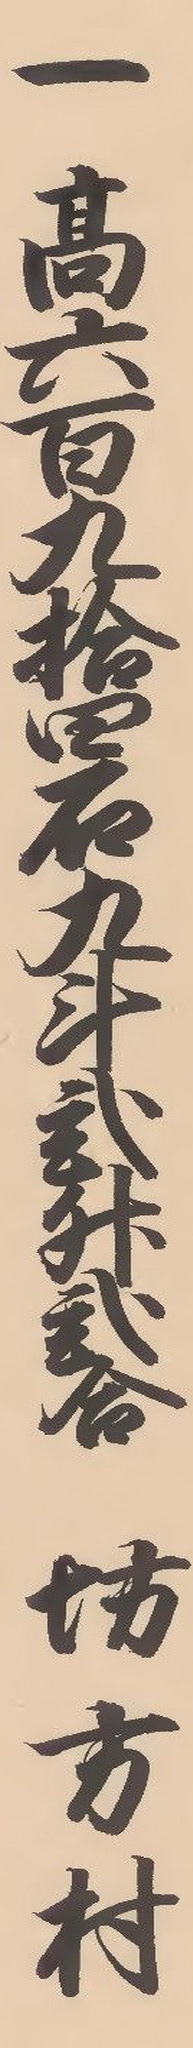一高六百九拾四石九斗弐升弐合坊方村
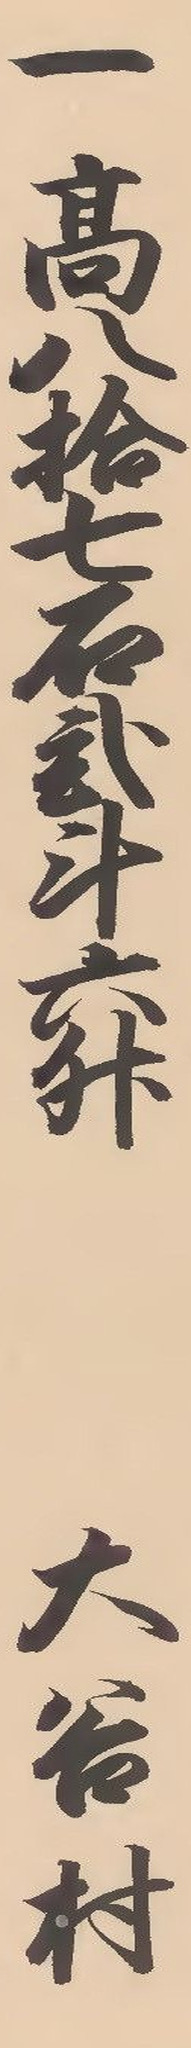一高八拾七石弐斗六升大谷村
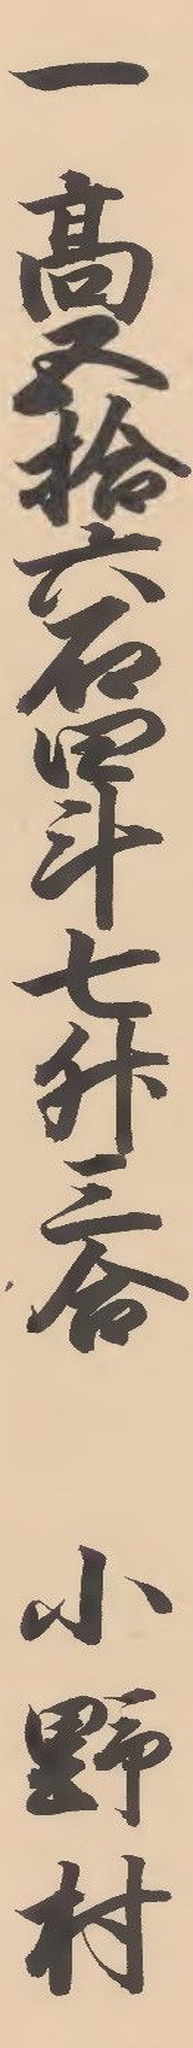一高五拾六石四斗七升三合小野村
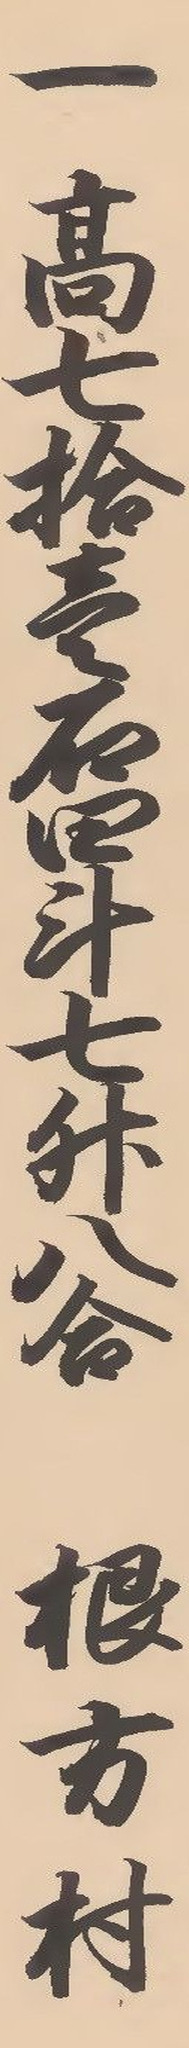一高七拾壱石四斗七升八合根方村
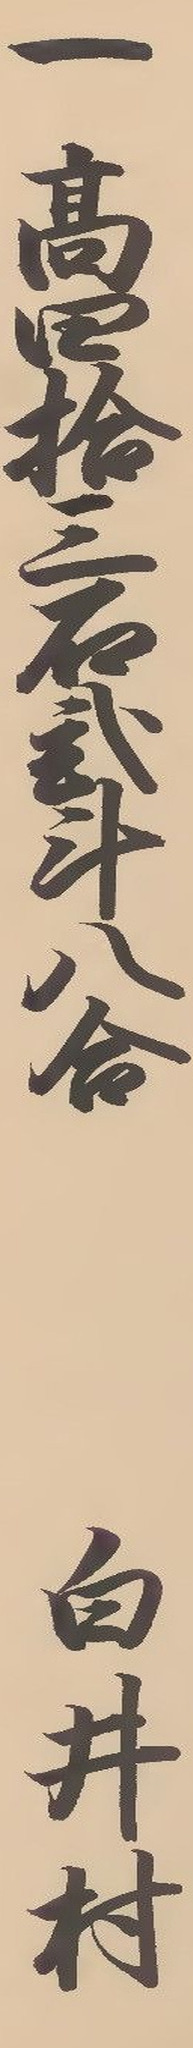一高四拾三石弐斗八合白井村
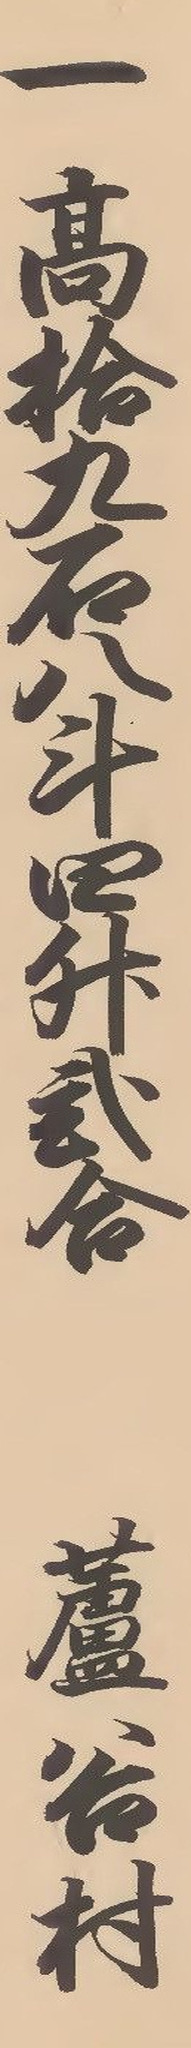一高拾九石八斗四升弐合蘆谷村
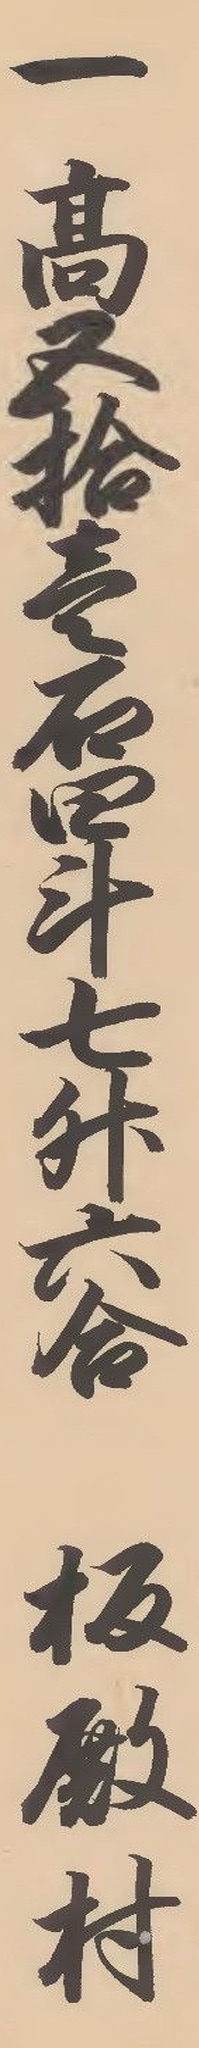一高五拾壱石四斗七升六合板殿村
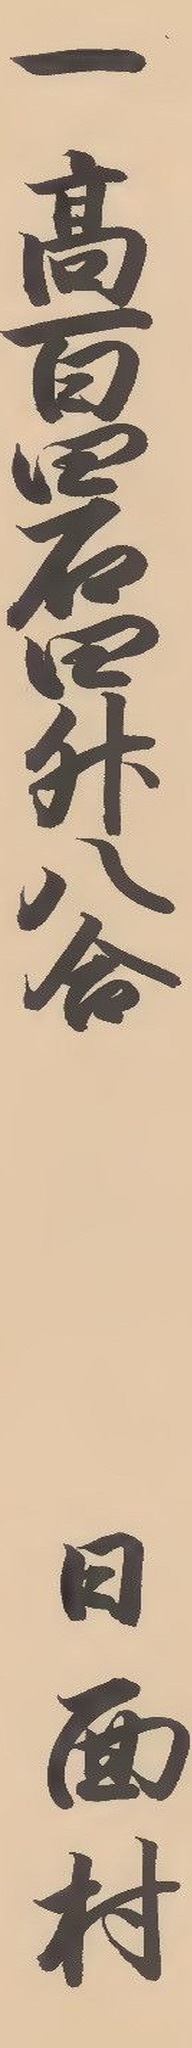一高百四石四升八合日面村

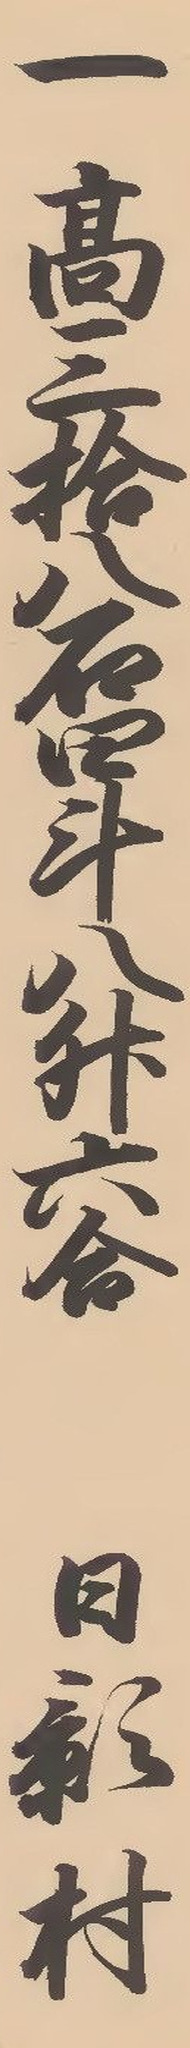一高三拾八石四斗八升六合日影村
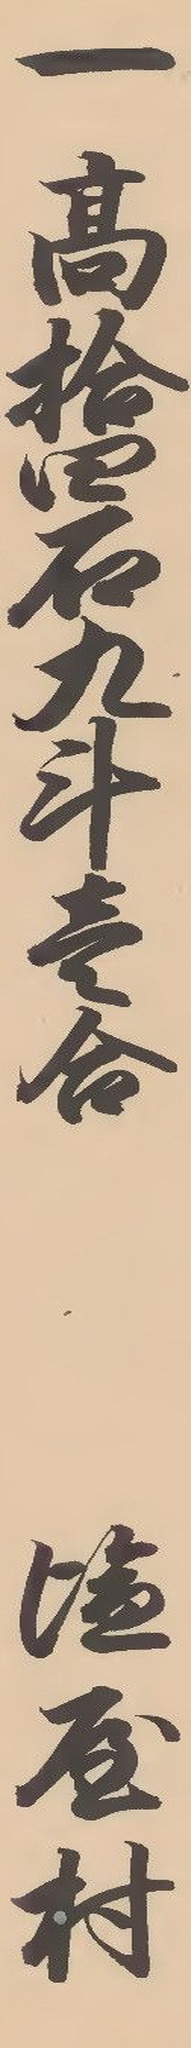一高拾四石九斗壱合塩屋村
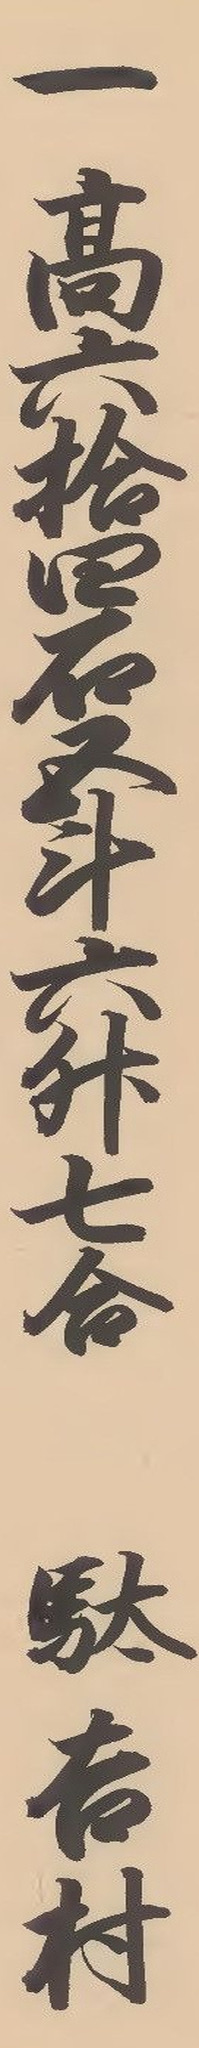一高六拾四石五斗六升七合駄吉村
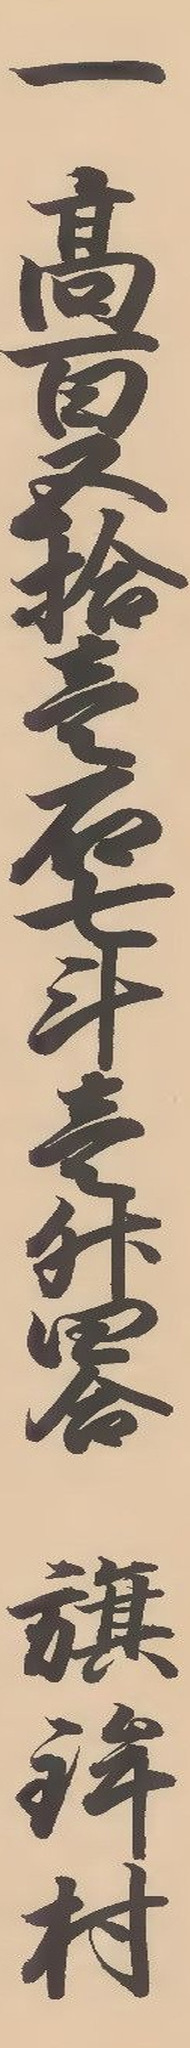一高百五拾壱石七斗壱升四合旗鉾村
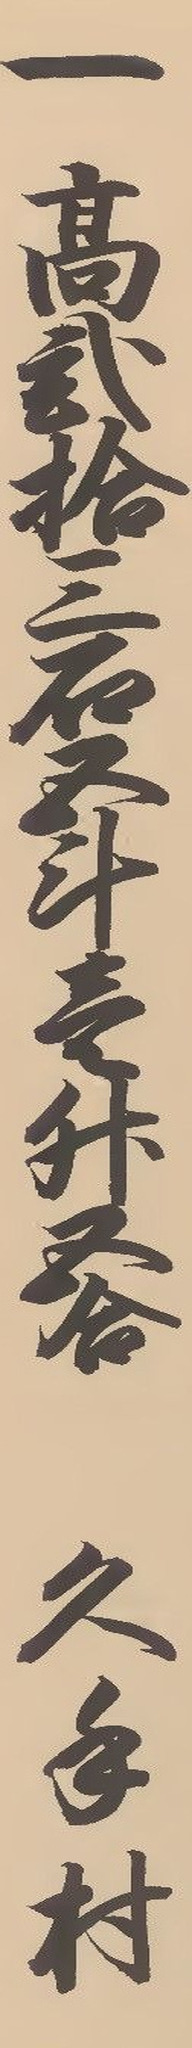一高弐拾三石五斗壱升五合久手村
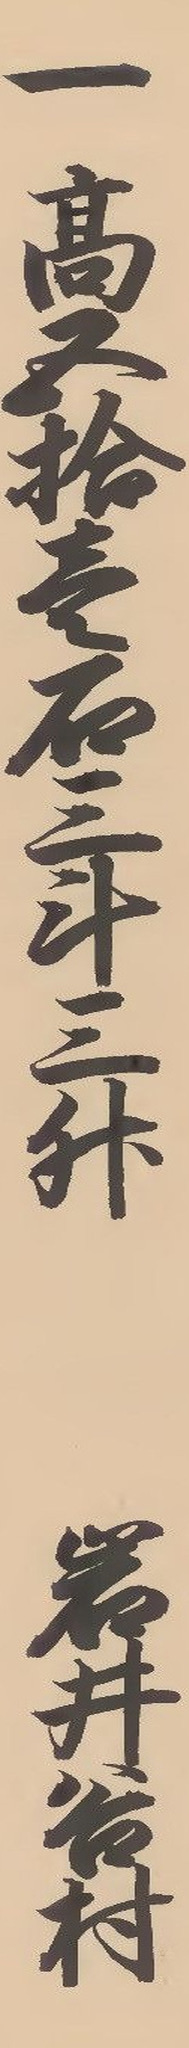一高五拾壱石三斗三升岩井谷村
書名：飛騨国郷帳
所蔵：国立公文書館 National Archives of Japan
